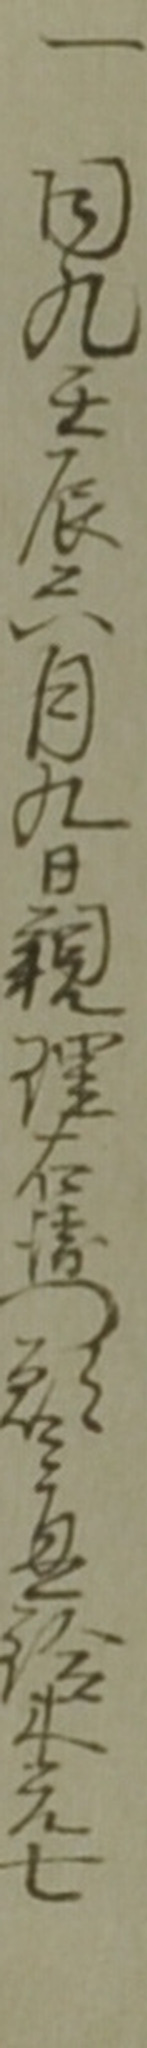一同九壬辰六月九日親理右衛門願之通鈴木元七
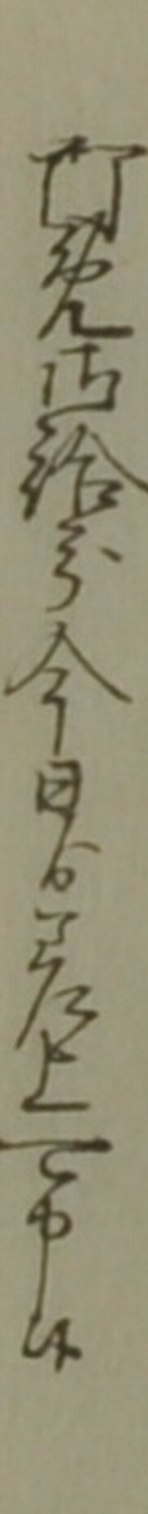御免御給分今日ゟ差上可申候
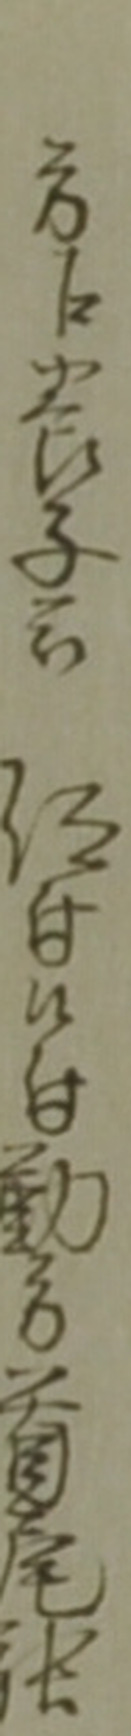方江養子被仰付候付勤方首尾能
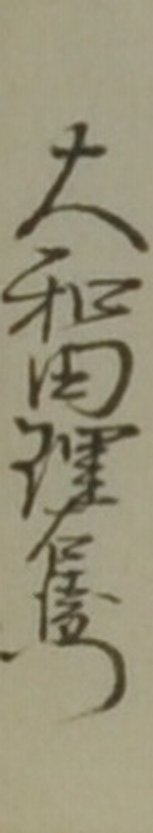大和田理右衛門
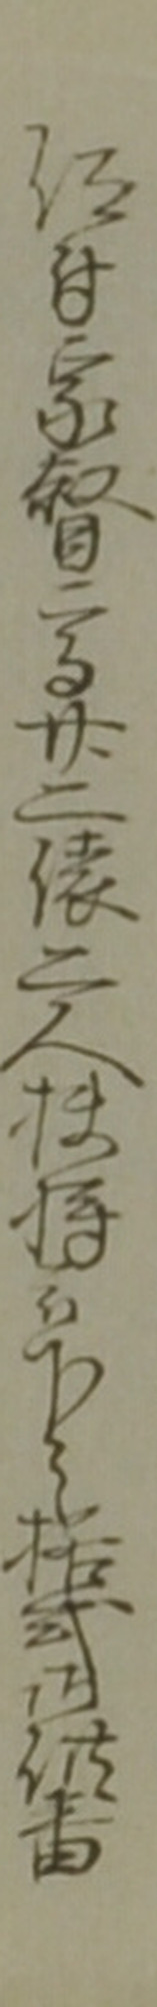仰付家督高廿二俵二人扶持被下之格式御供番
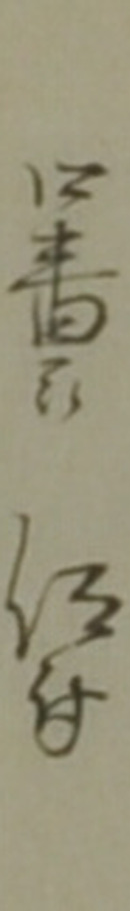口番被仰付
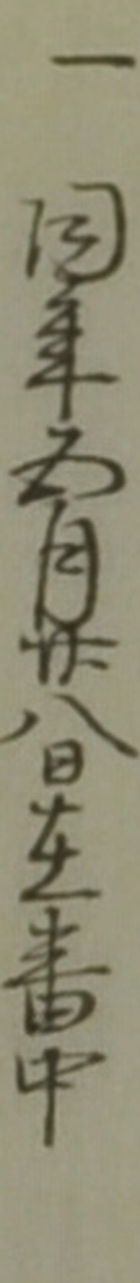一同年五月廿八日在番中
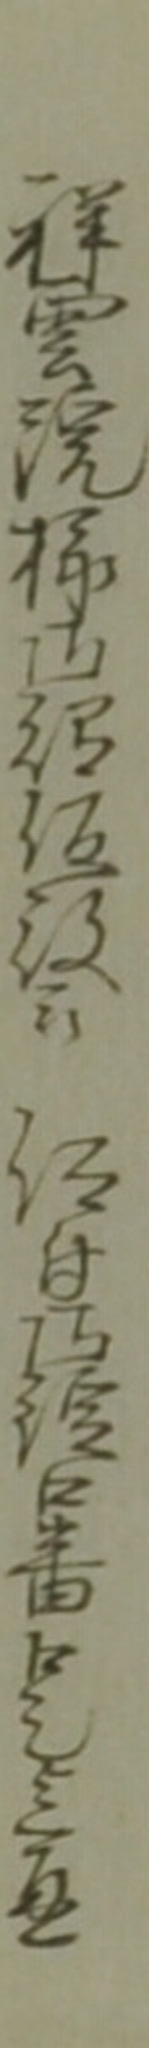祥雲院様御賄仮役被仰付御錠口番是迄通
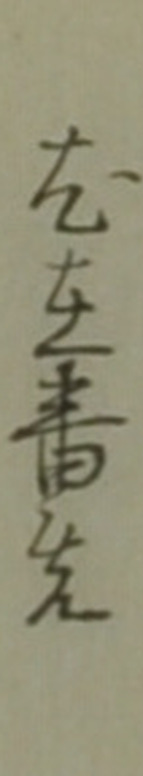尤在番先
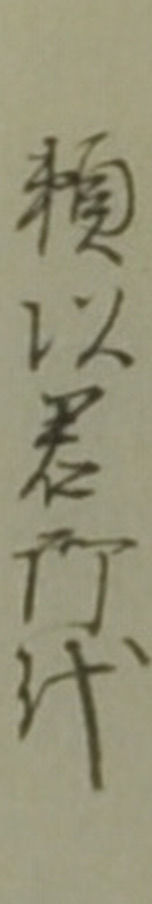頼以君御代
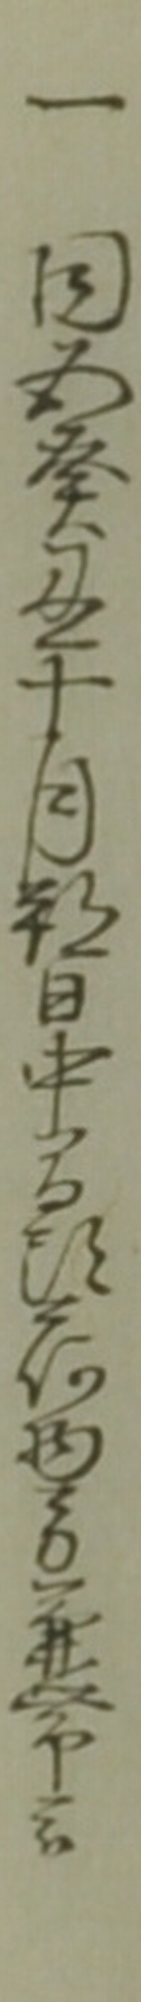一同五癸丑十月朔日中間頭荷物方兼帯被
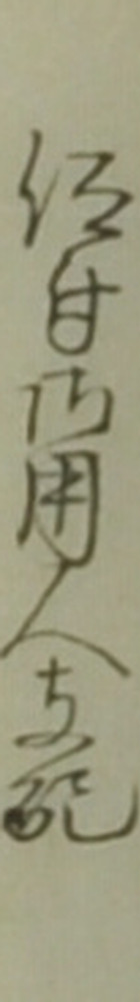仰付御用人支配

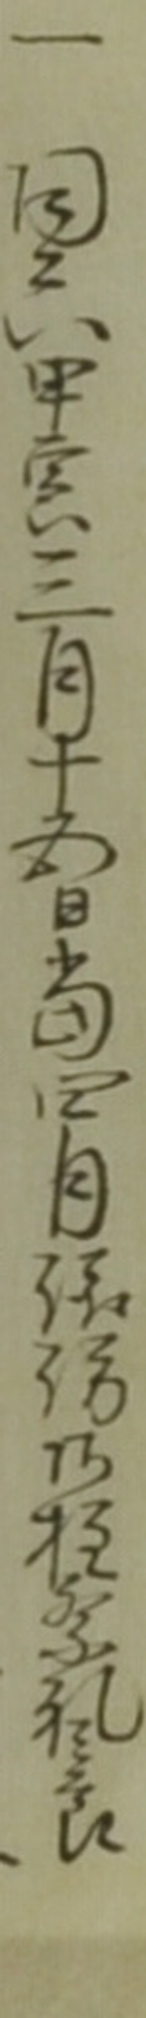一同六甲寅三月十五日当四月諏訪御柱祭礼之節
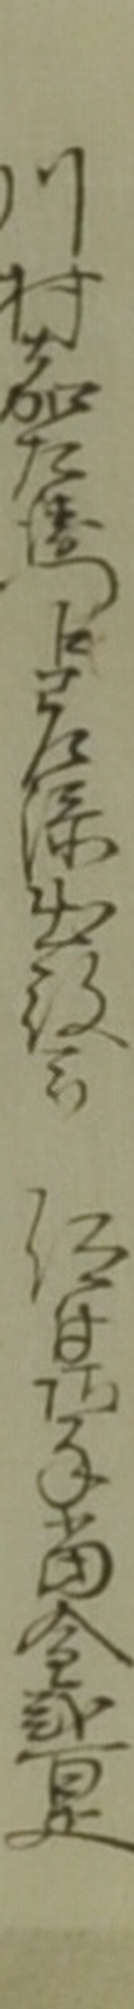川村嘉左衛門江差添出役被仰付御手当金弐百疋
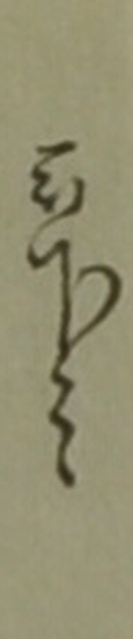被下之
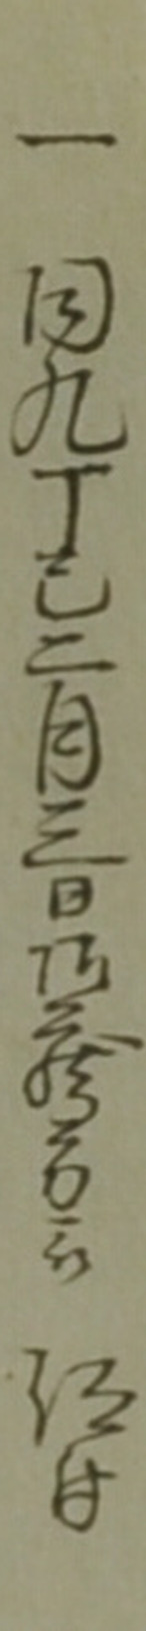一同九丁巳二月三日御蔵方被仰付
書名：無足諸士勤仕録（三）
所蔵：伊那市立高遠町図書館・合同会社AMANE
